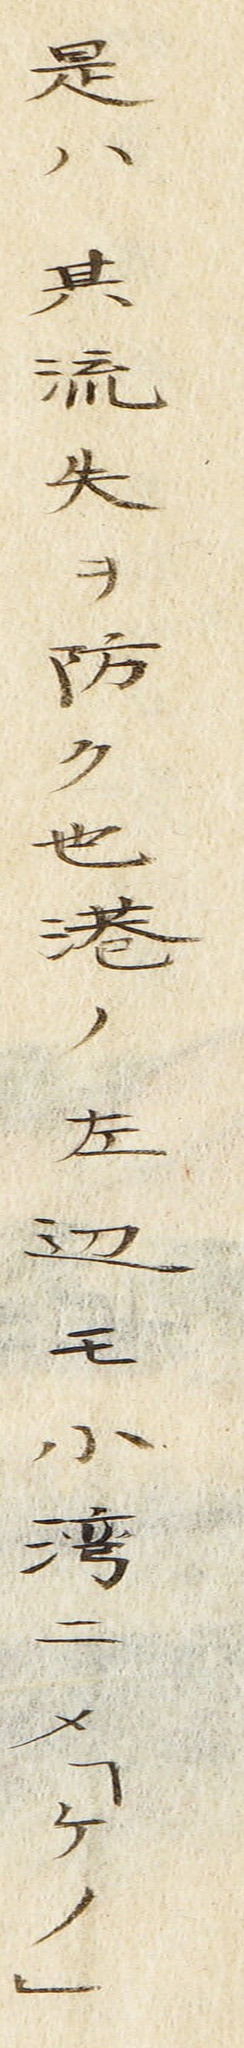是ハ其流失ヲ防ク也港ノ左辺モ小湾ニシテ「ケノ」
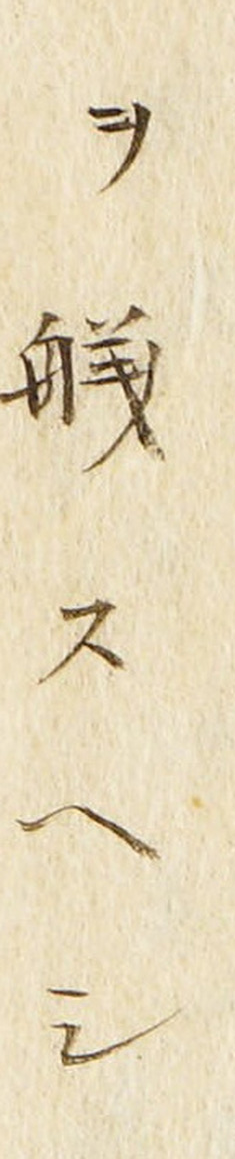ヲ艤スヘシ

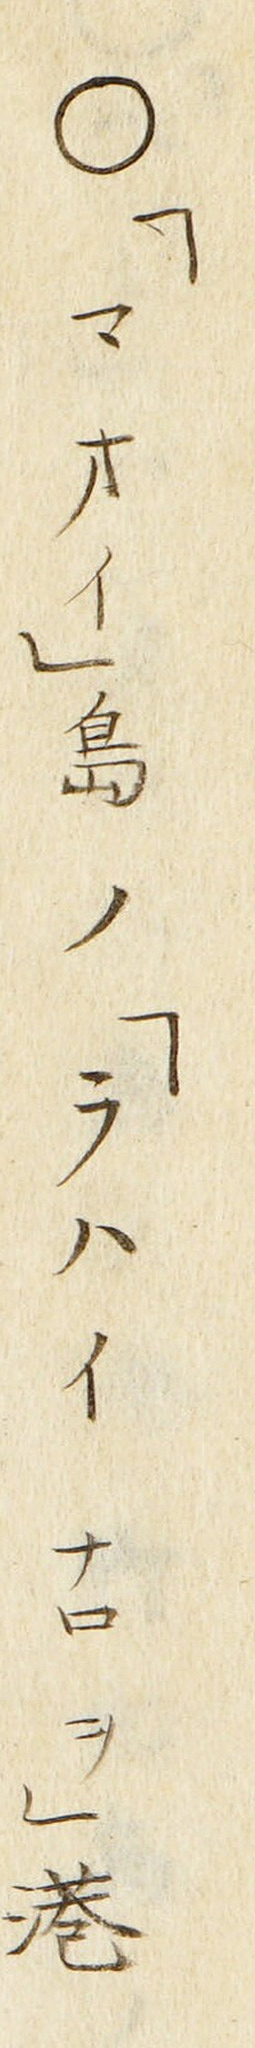○「マオイ」島ノ「ラハイナロヲ」港

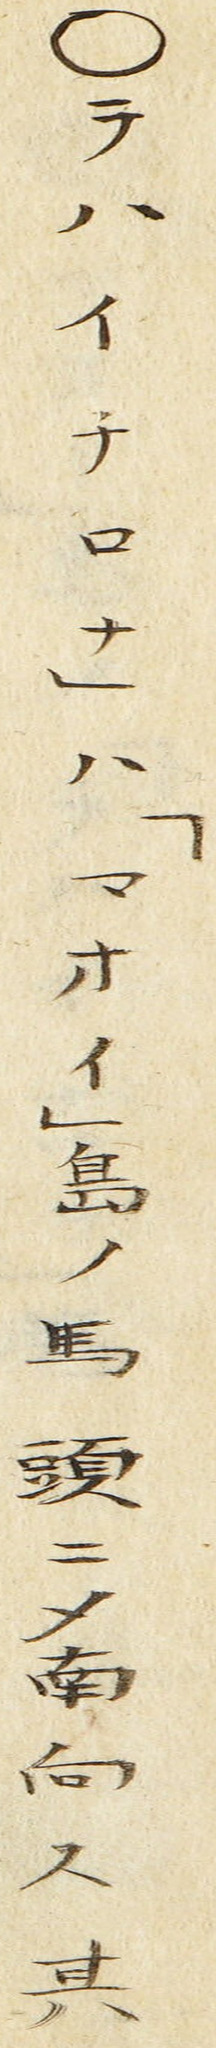○ラハイチロナ」ハ「マオイ」島ノ馬頭ニシテ南向ス其
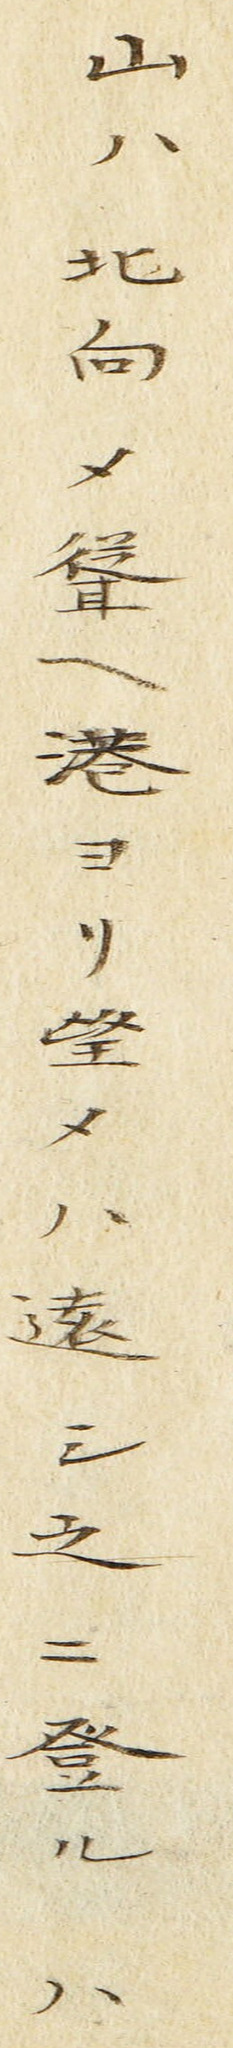山ハ北向シテ聳ヘ港ヨリ望メハ遠シ之ニ登ルハ
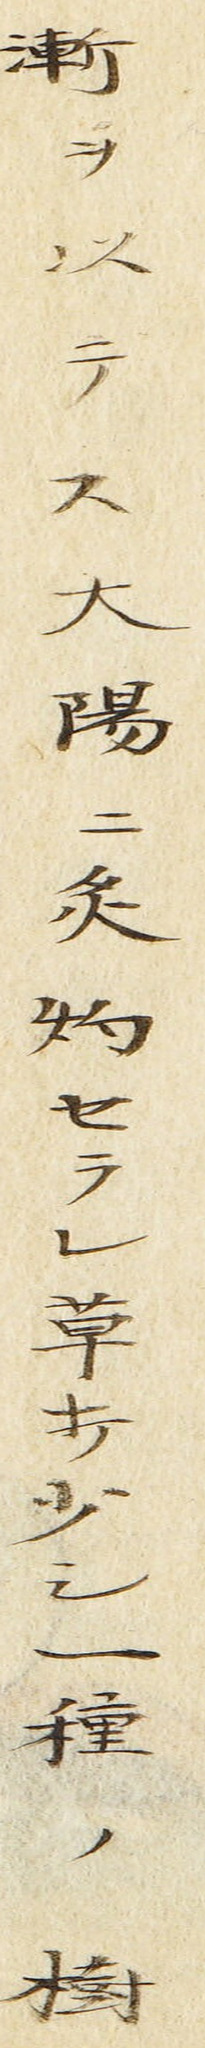漸ヲ以テス大陽ニ炙灼セラレ草打少シ一種ノ樹
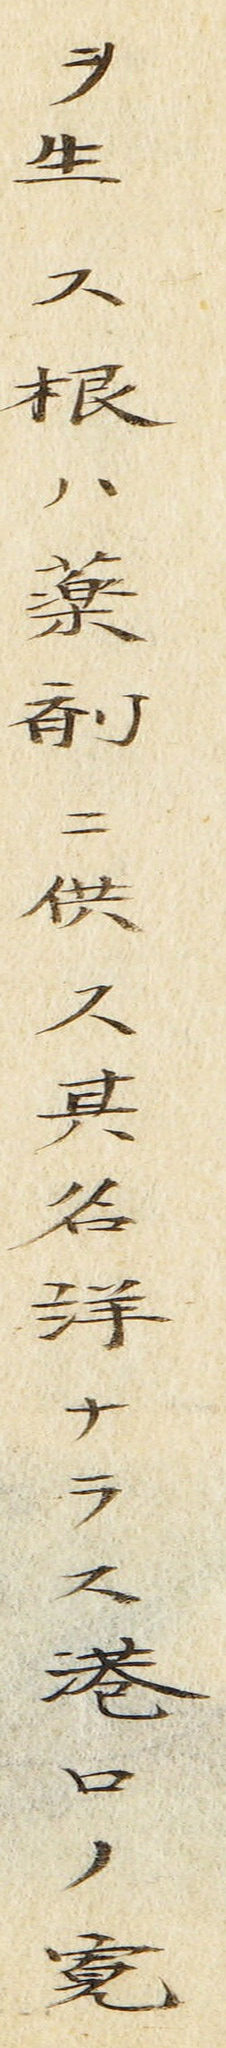ヲ生ス根ハ薬剤ニ供ス其名詳ナラス港口ノ寛
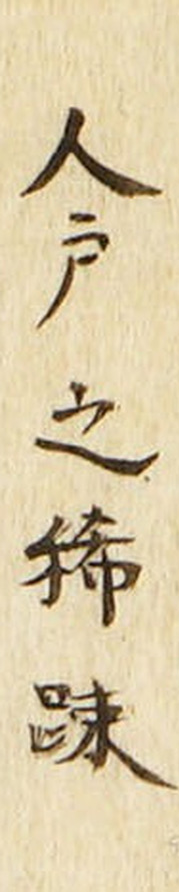人戸之稀疎
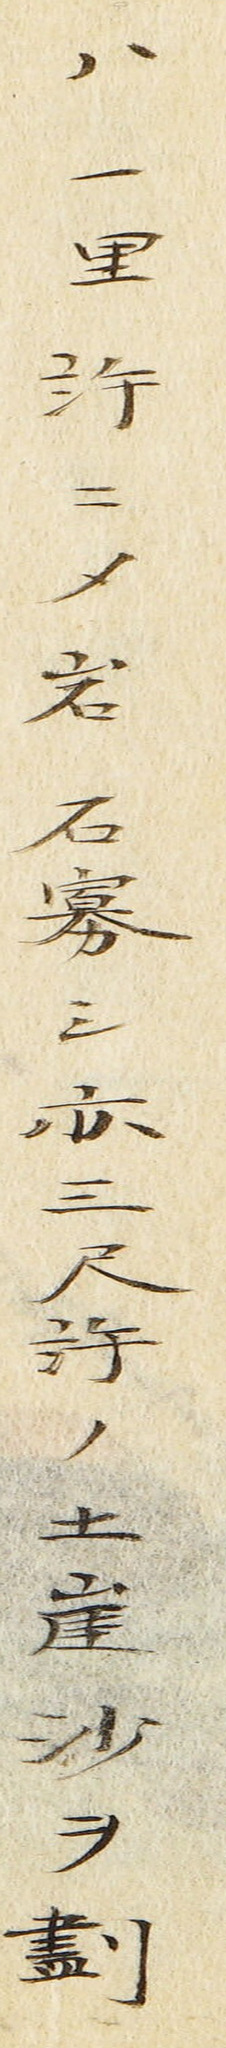ハ一里許ニシテ岩石寡シ亦三尺許ノ土崖沙ヲ劃
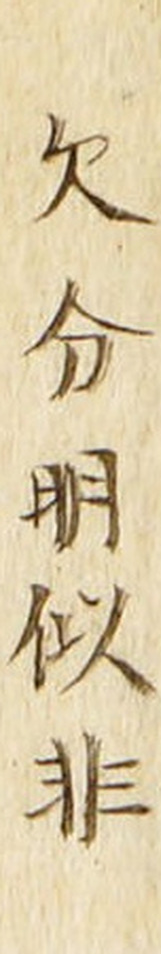欠分明似非
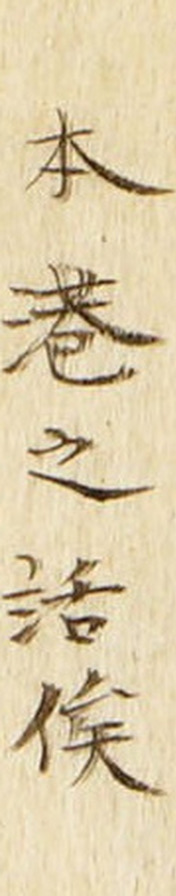本港之話俟
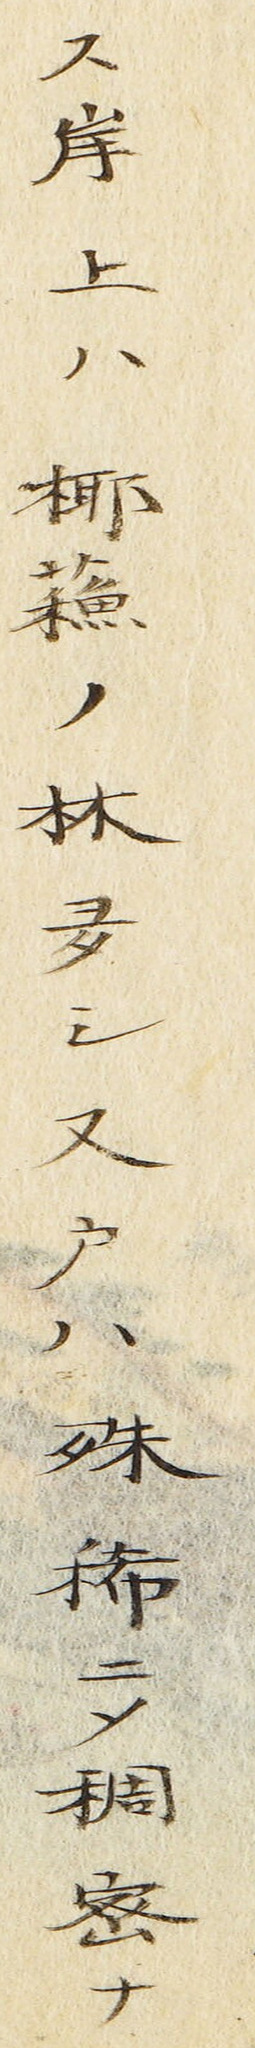ス岸上ハ椰蘓ノ林多シ又戸ハ殊稀ニシテ稠密ナ
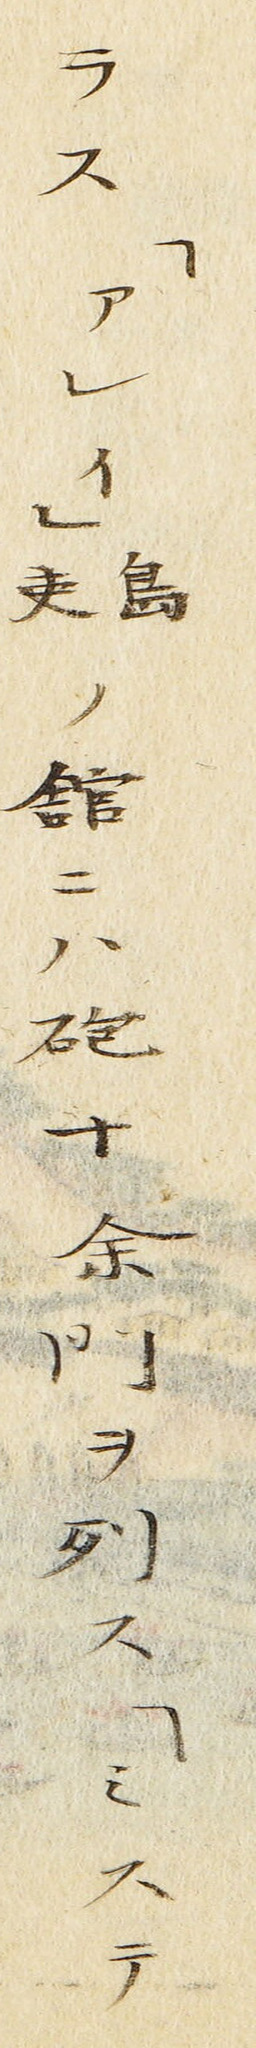ラス「アレイ」島吏ノ館ニハ砲十余門ヲ列ス「ミステ
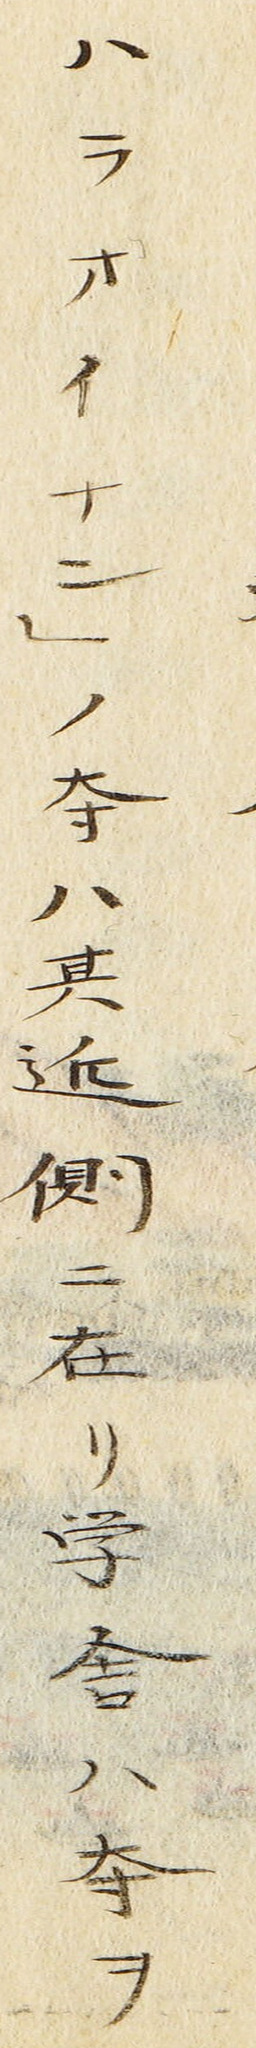ハラオイナン」ノ夺ハ其近側ニ在リ学舎ハ夺ヲ
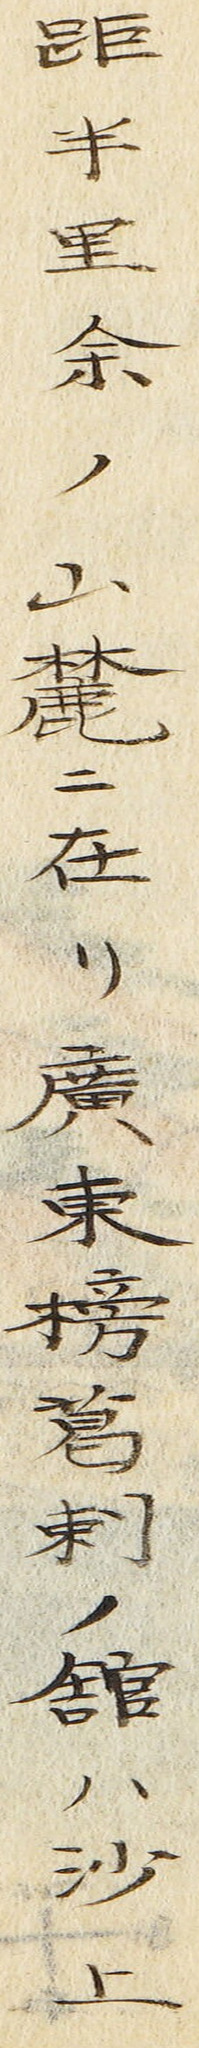距半里余ノ山麓ニ在リ広東榜葛刺ノ館ハ沙上
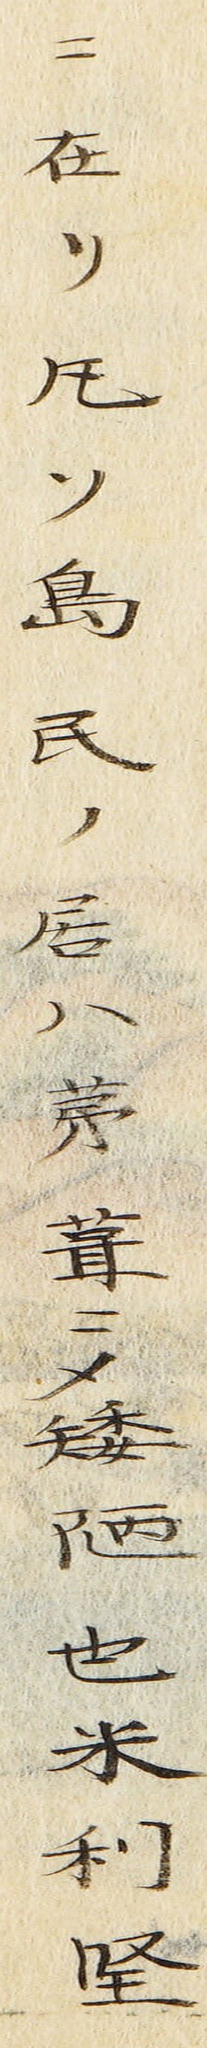ニ在リ凡ソ島民ノ居ハ茅葺ニシテ矮陋也米利堅
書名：流蕃通書
